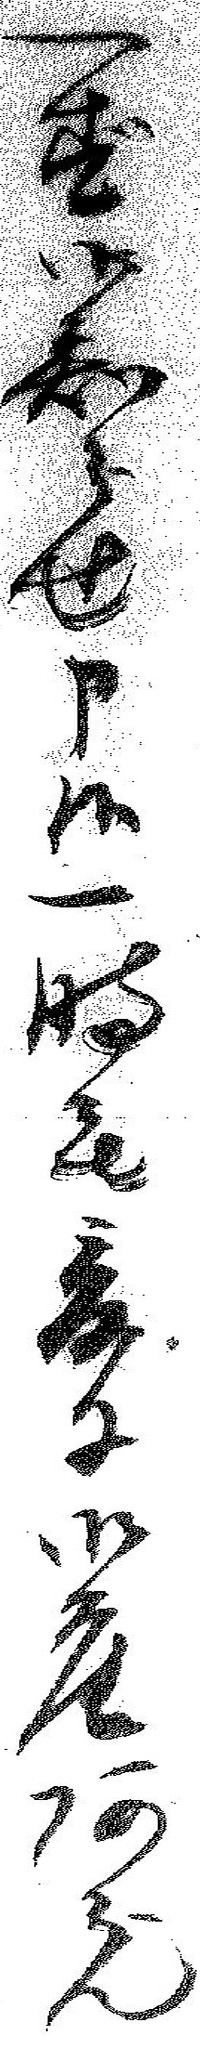へず御知らせ申候一時も爰に御座あらん
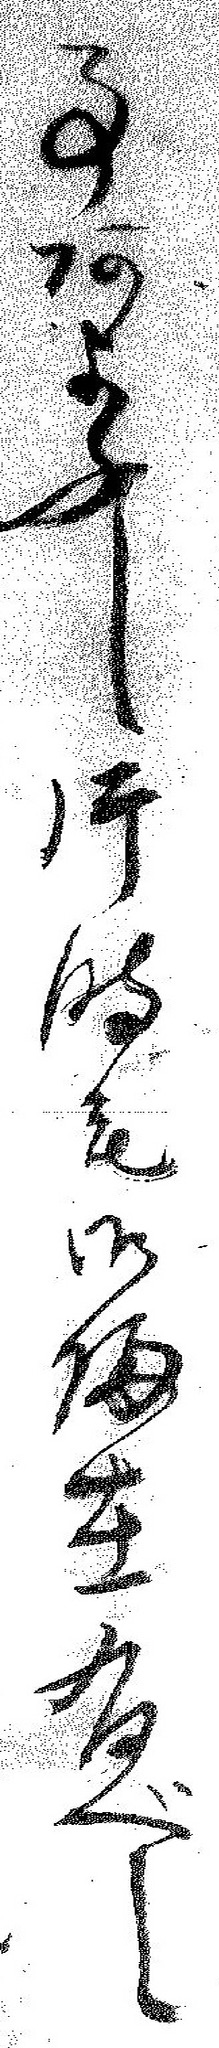事あよふし片時も御帰在有べし
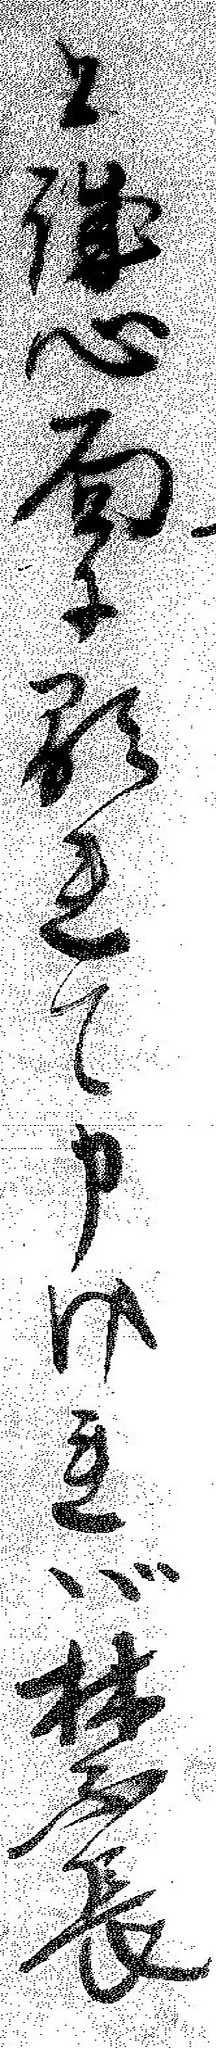と誠心面に顕れて申ければ禁長

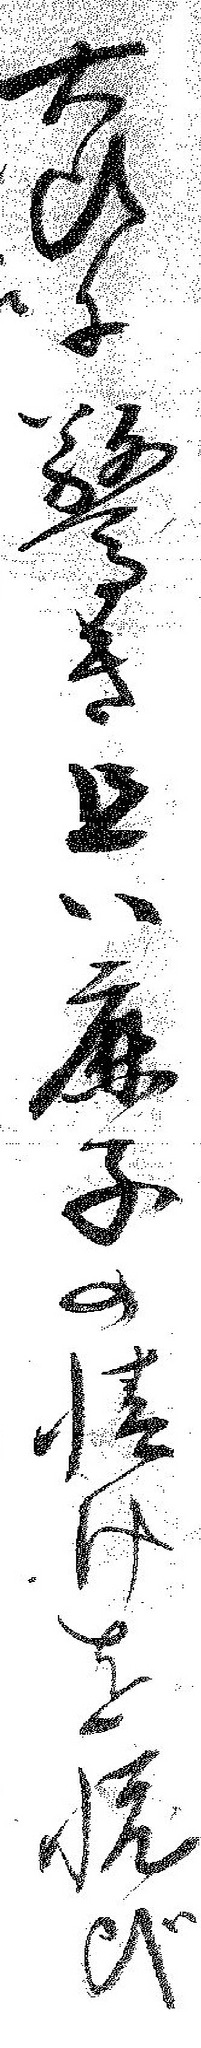大ひに驚き且は鹿子の情けを悦び
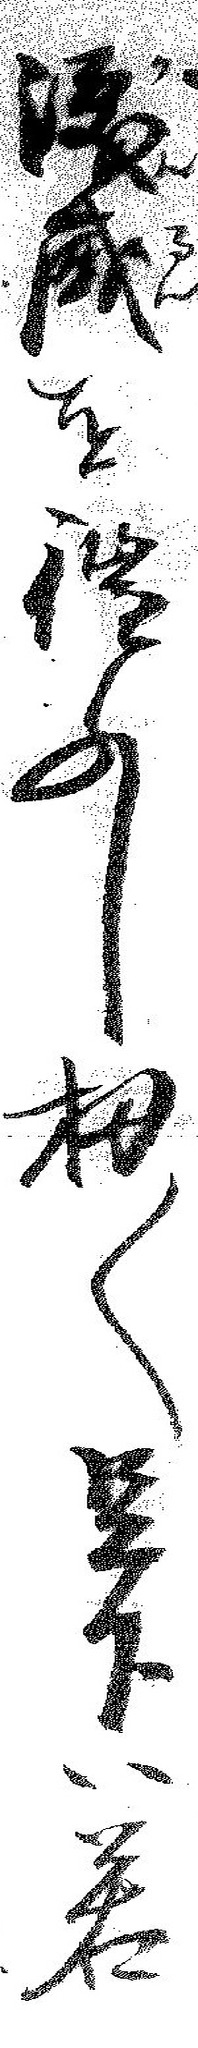涙咸を催ふし扨〳〵足下は若
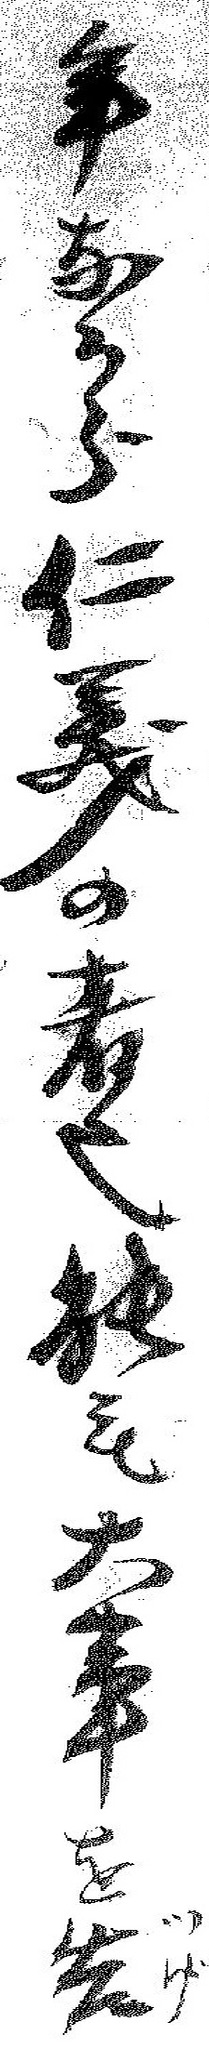年なから仁義の者也能も大事を告
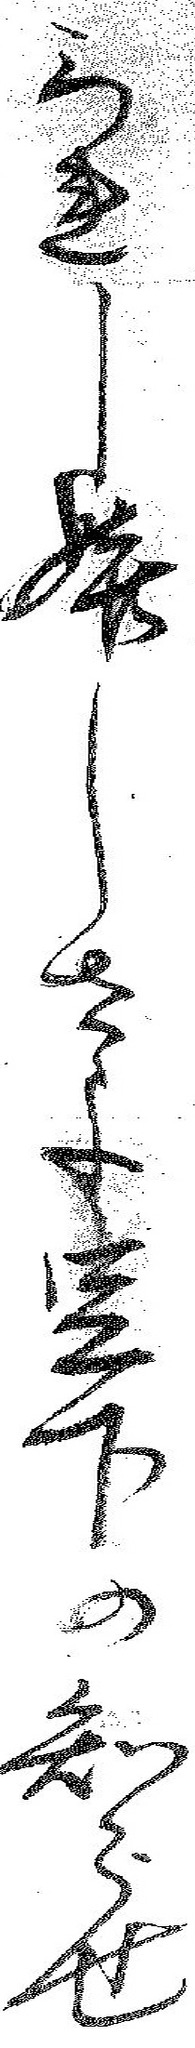られし嬉しさに足下の知らせ
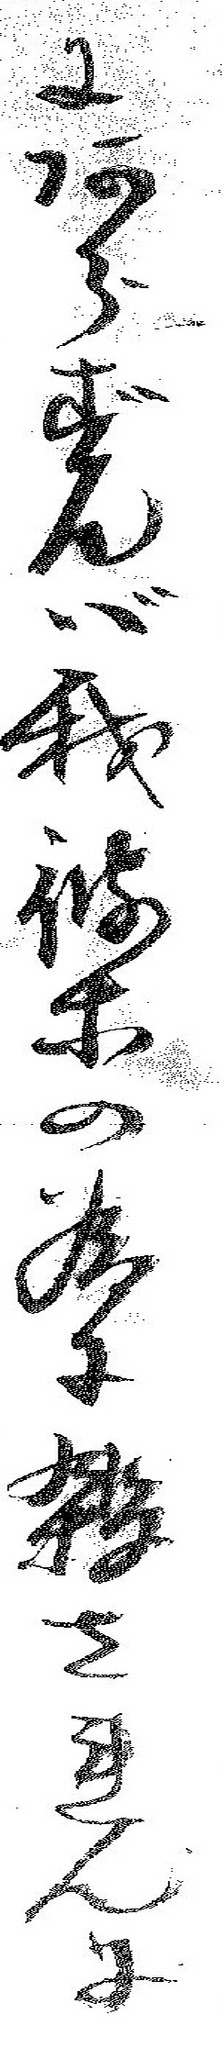にあらずんば我彼等の為に殺されんに
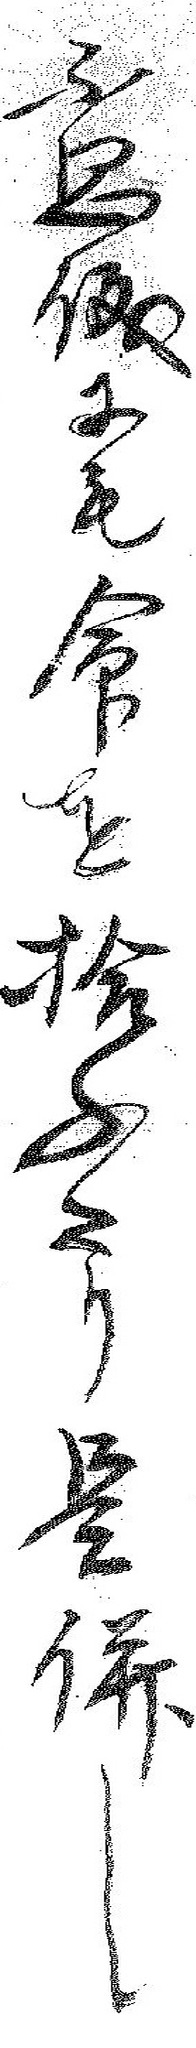不思議にも命を拾ふたり是併し
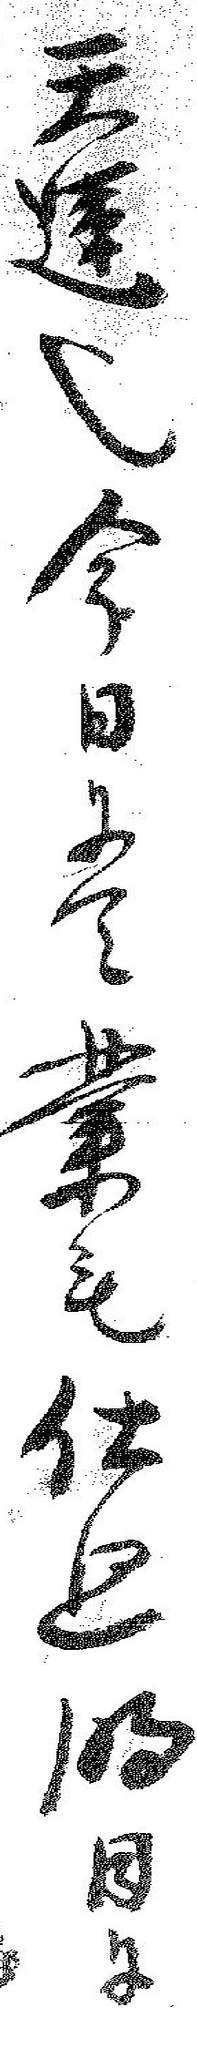天運也今日にて業も仕廻明日に
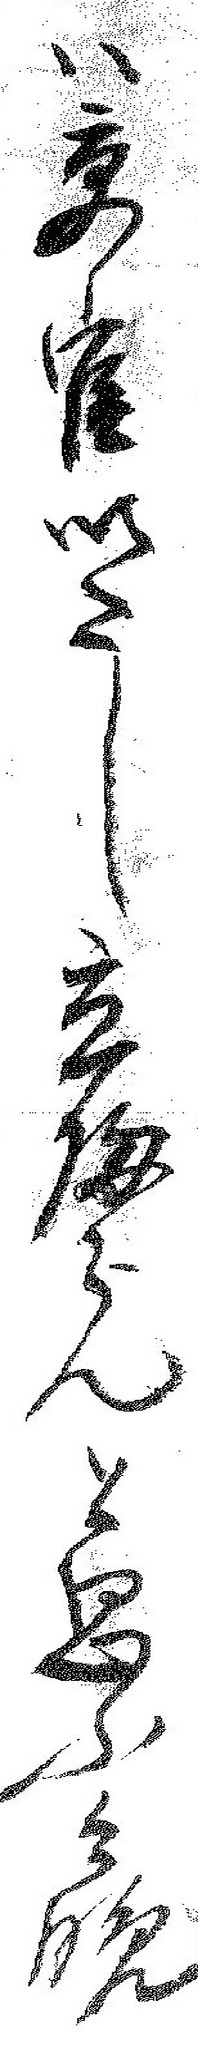は受官いたし立帰らんと思ふ今晩
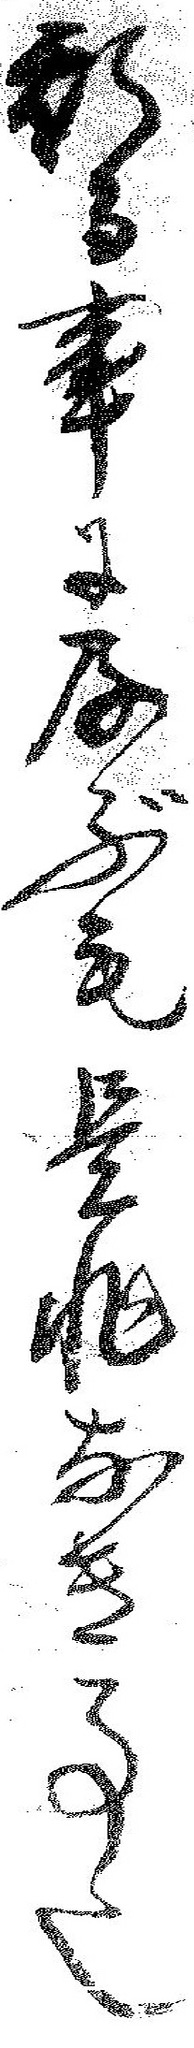斯る事に及ぶも是非なき事也
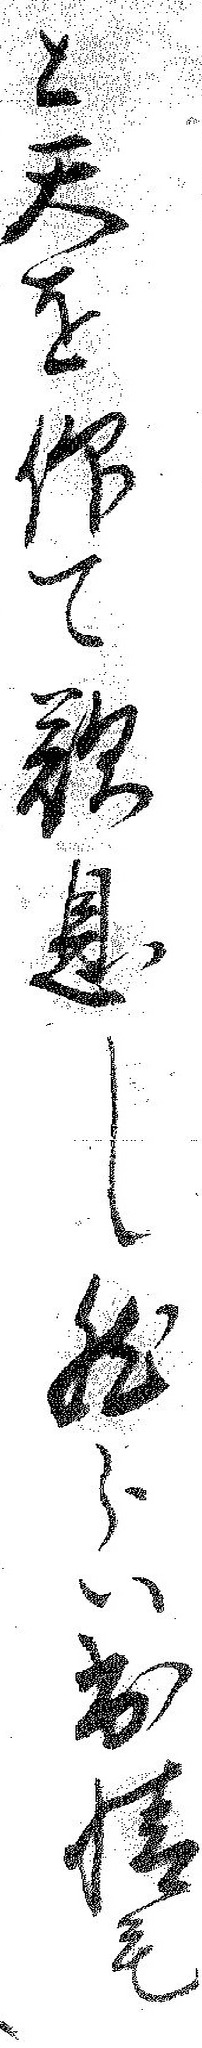と天を仰て歎息し然らは出精も
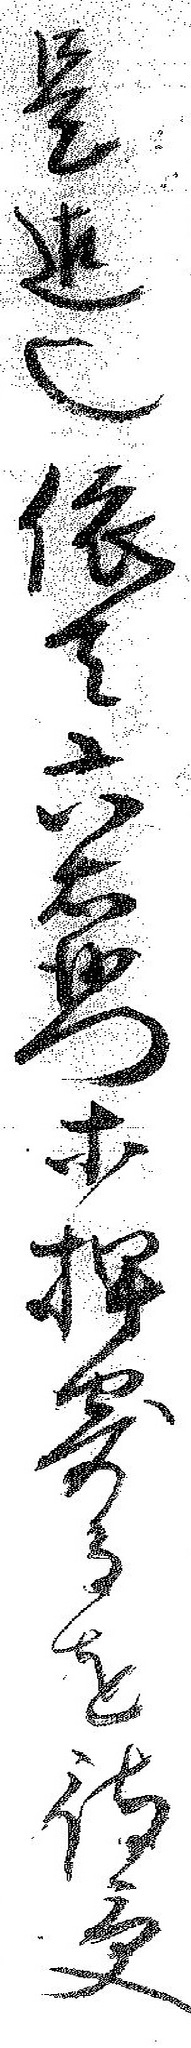是迄也依て六右衛門等押寄るを待受
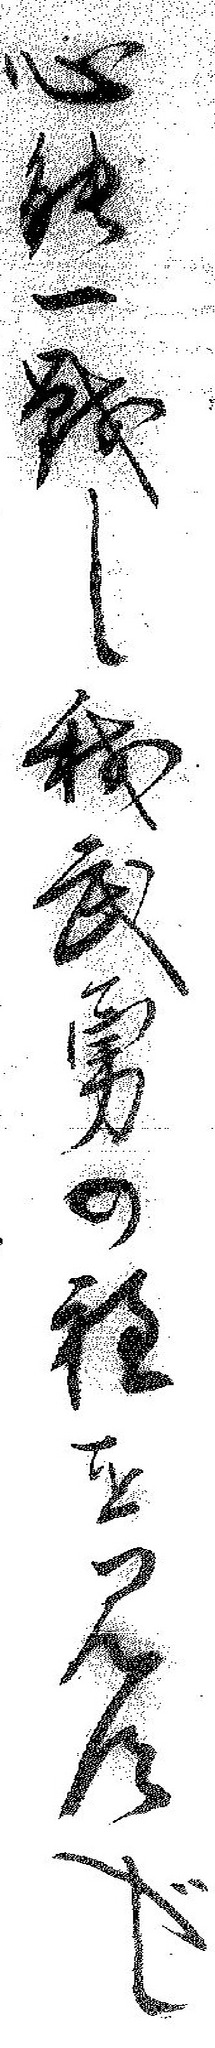心能一戦し我武勇の程を見すべし
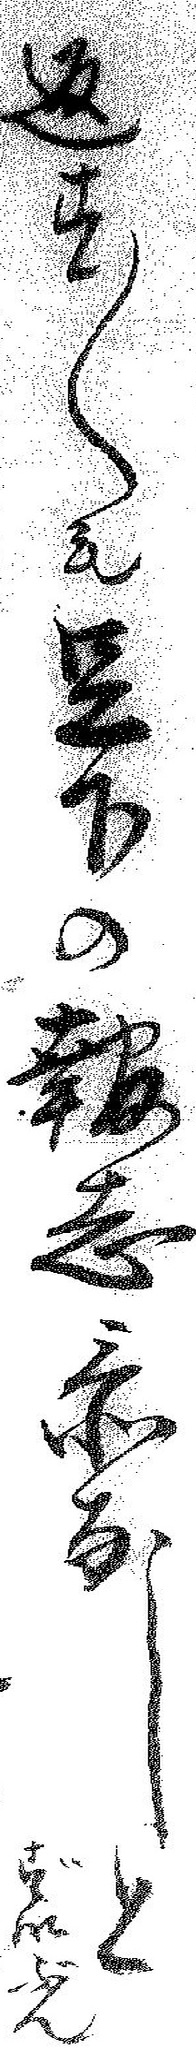返す〳〵も足下の報志忝なしと
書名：近頃古狸珍説　礼義智信
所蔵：徳島県立図書館
